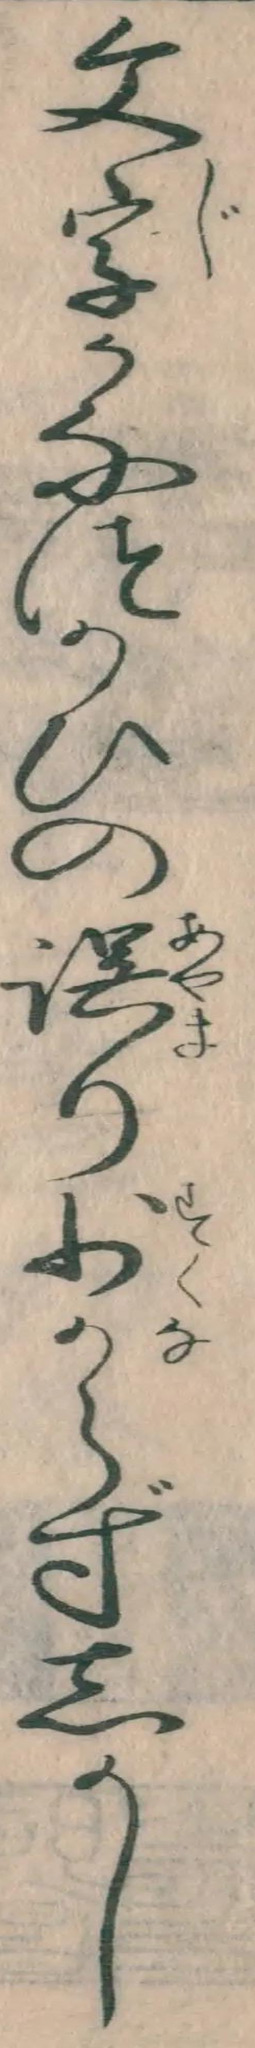文字かなつかひの誤り少からずしかし
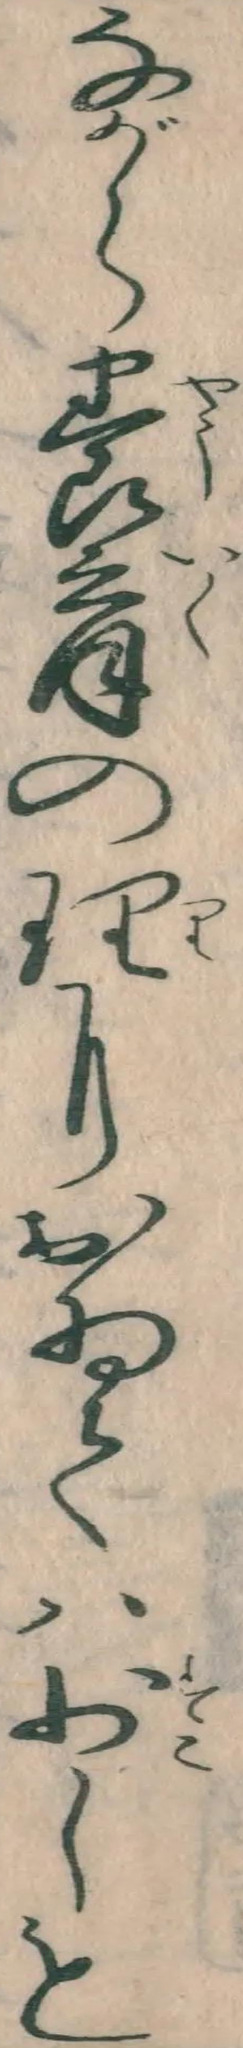ながら養育の理におゐては少しも
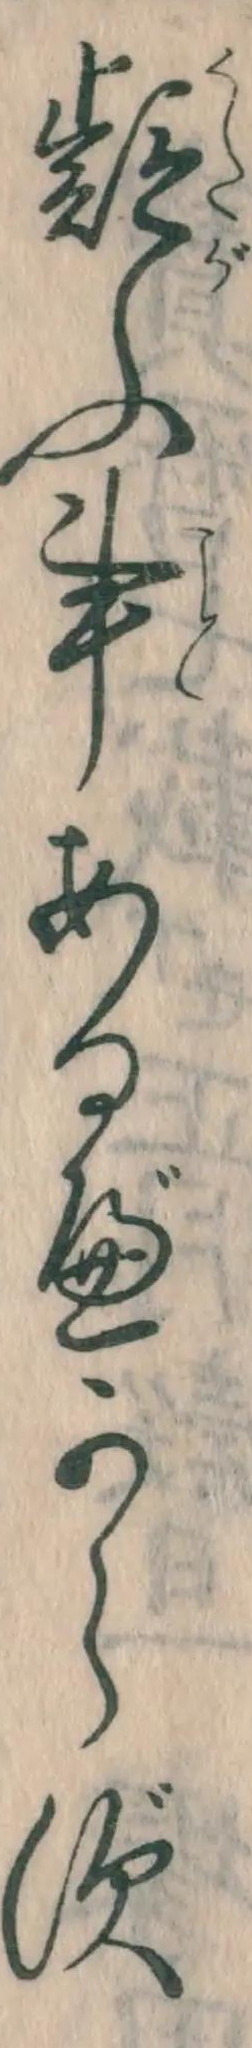疑ふ事あるべからず

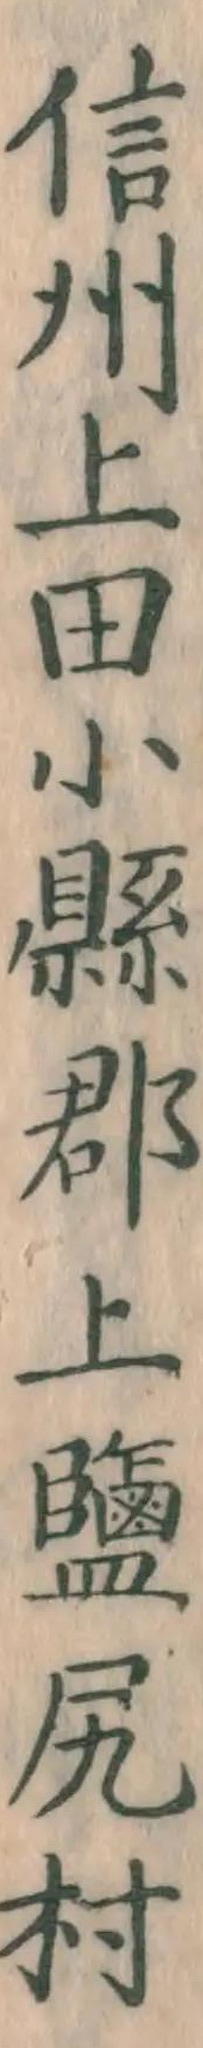信州上田小県郡上塩尻村
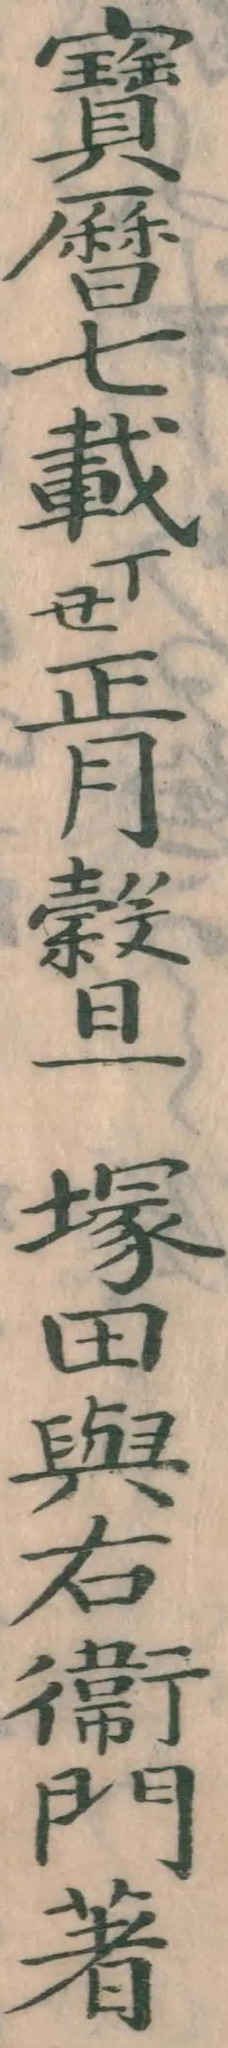宝暦七載丁丑正月穀旦塚田與右衛門著
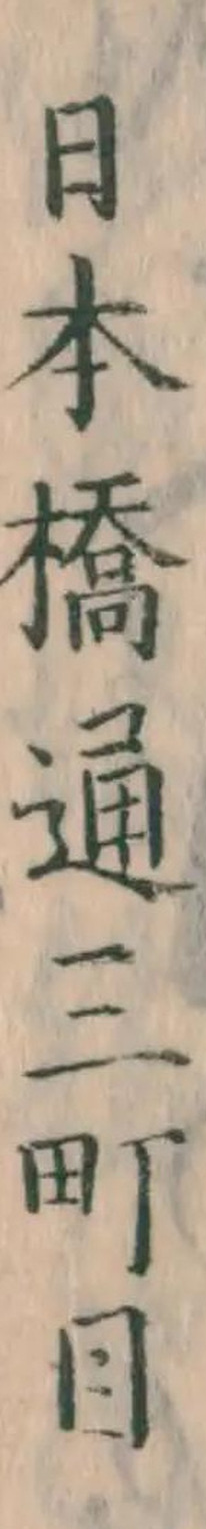日本橋通三町目
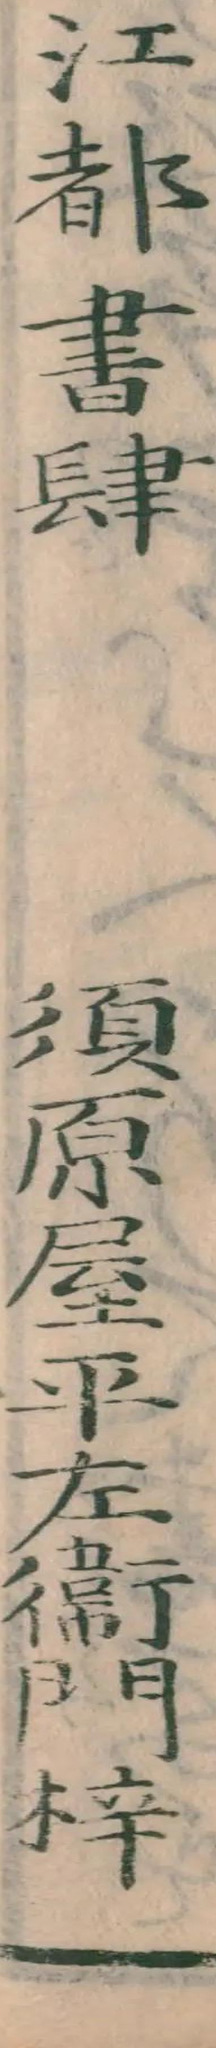江都書肆須原屋平左衛門梓
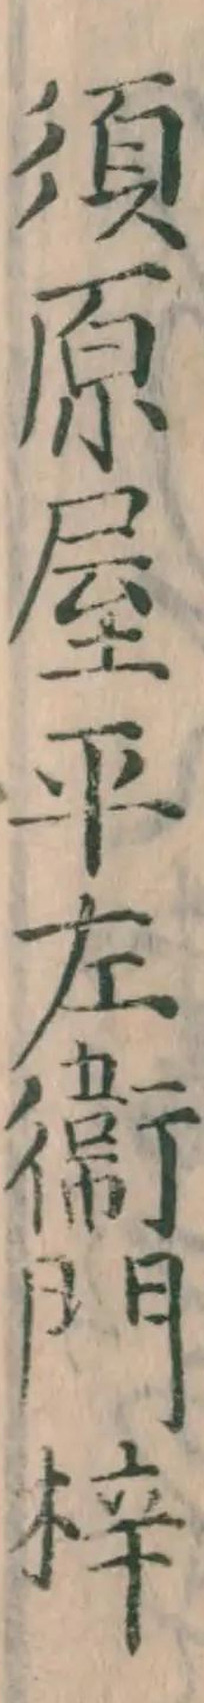須原屋平左衛門
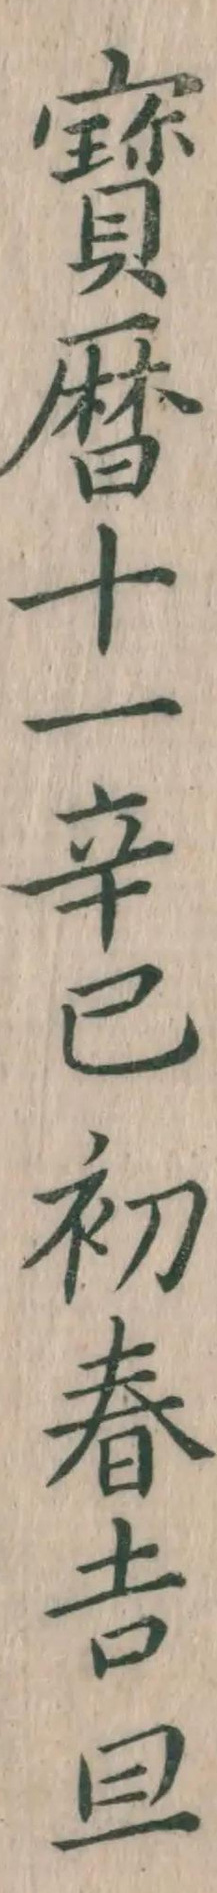宝暦十一辛巳初春吉旦
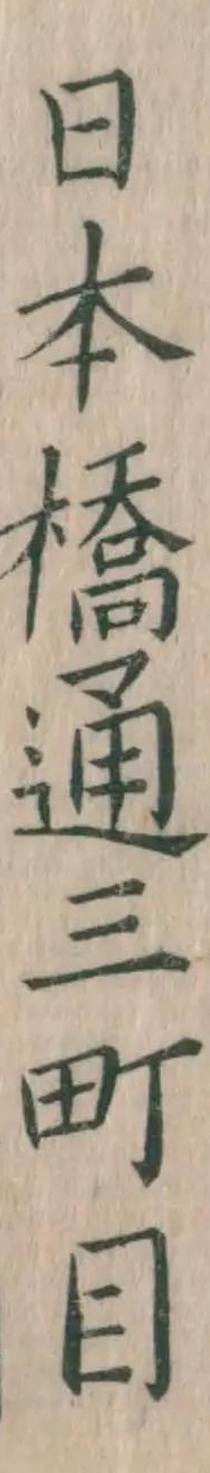日本橋通三町目
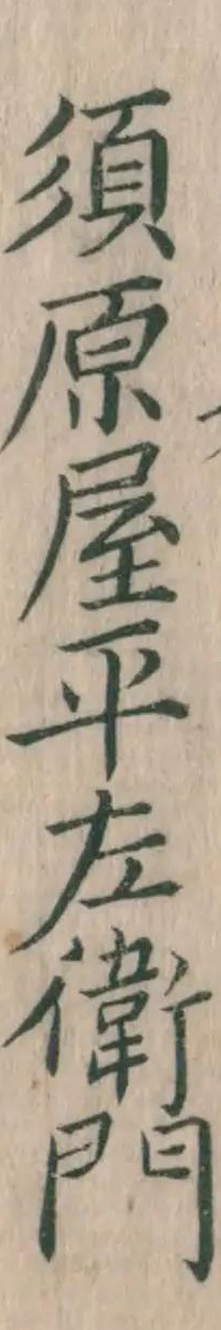須原屋平左衛門
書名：新撰養蚕秘書
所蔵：国立国会図書館 National Diet Library, JAPAN
